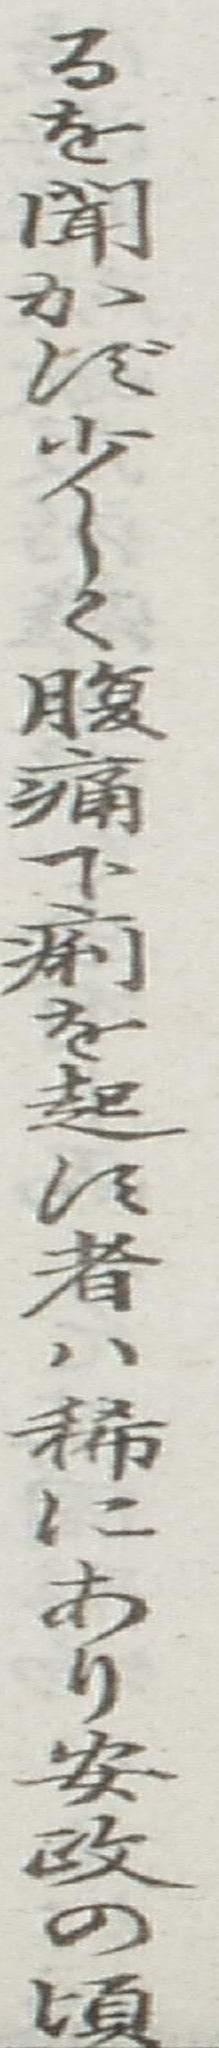るを聞かず少して腹痛下痢を起す者は稀にあり安政の頃
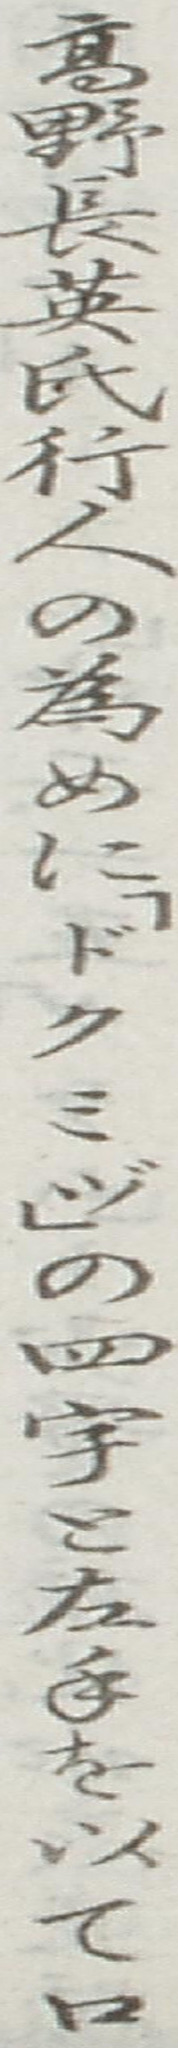高野長英氏行人の為に「ドクミヅ」の四字と左手を以て口
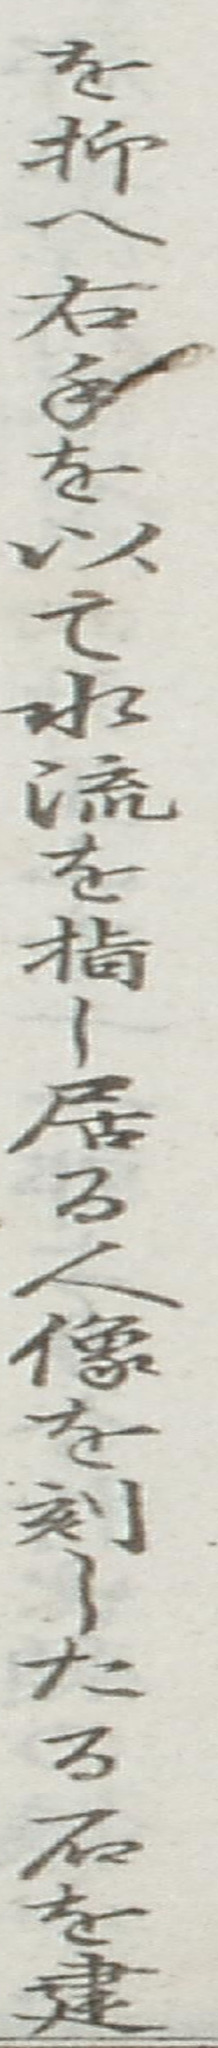を抑へ右手を以て水流を指し居る人像を刻したる石を建
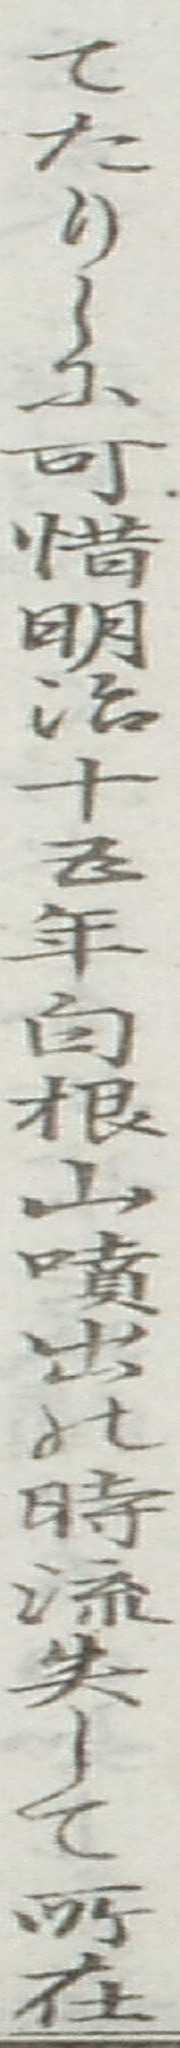てたりしに可惜明治十五年白根山噴出の時流出して所在
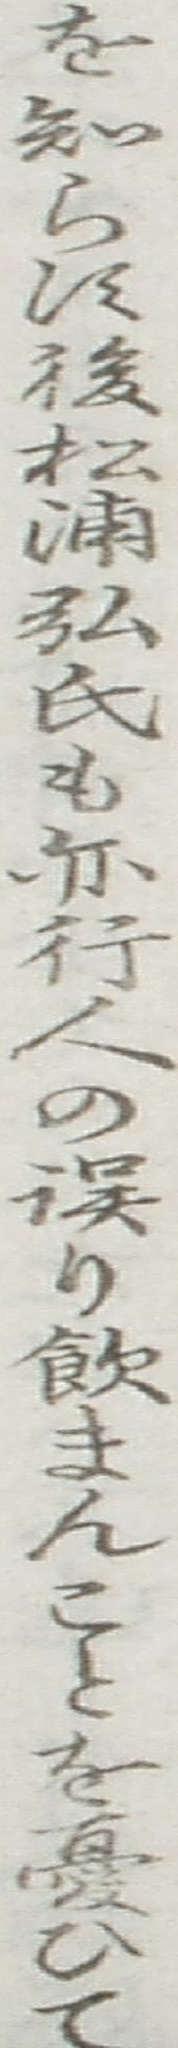を知らす後松浦弘氏も亦行人の誤り飲まんことを憂いて
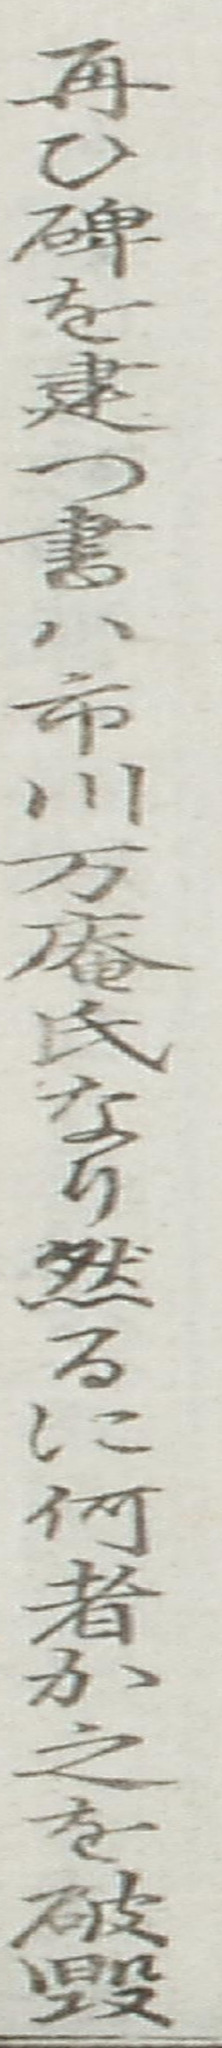再ひ碑を建つ書は市川万庵氏なり然るに何者か之を破毀

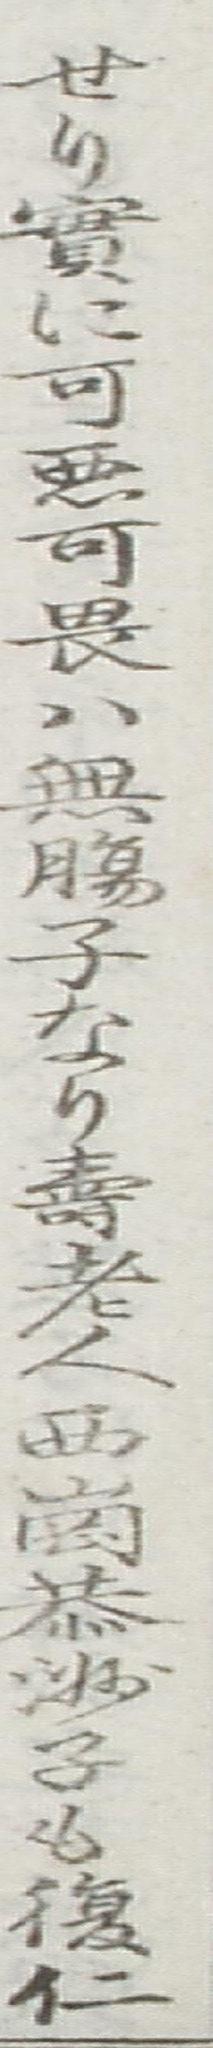せり実に可悪可畏は無膓子なり寿老人西崗恭助子も復仁
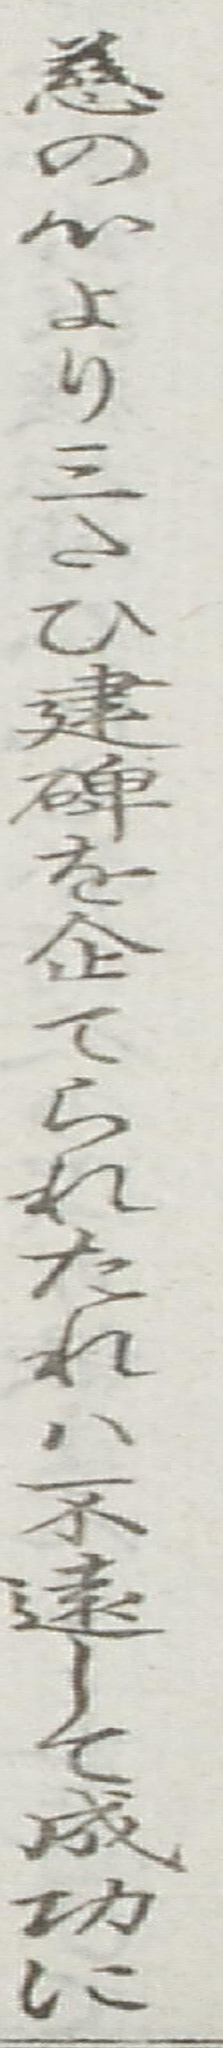慈の心より三たひ建碑を企てられたれは不遠して成功に
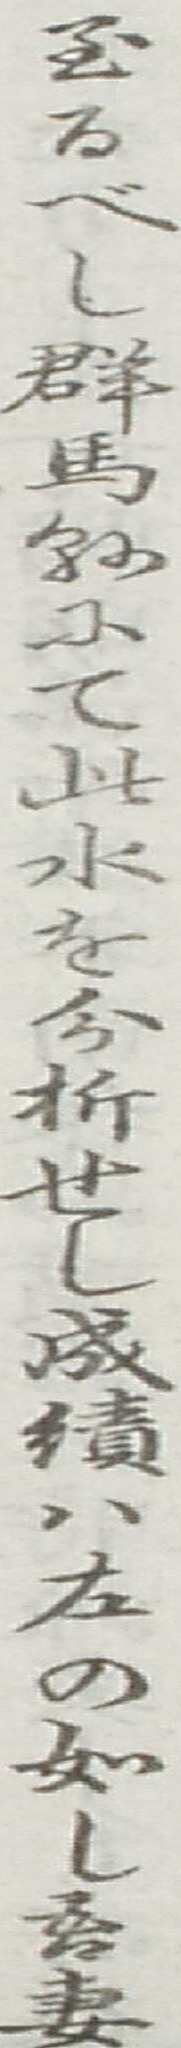至るべし群馬県にて此水を分析せし成績は左の如し我妻
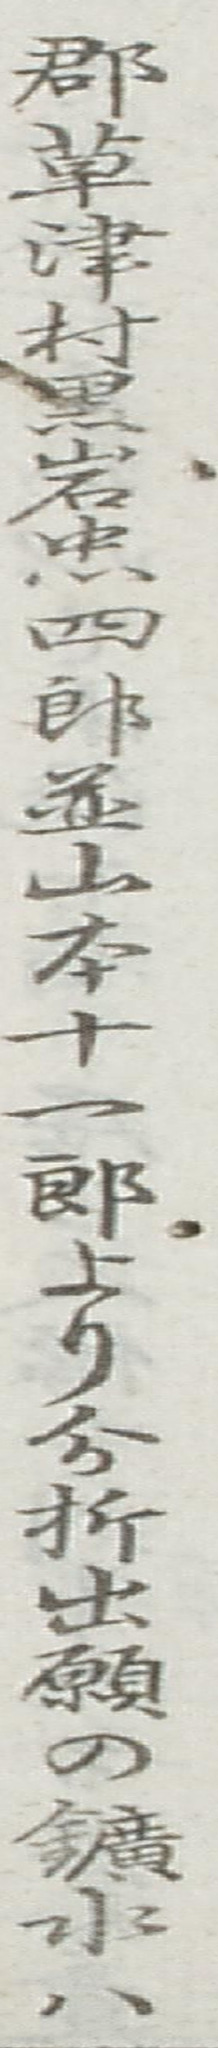郡草津村黒岩忠四郎並山本十一郎より分析出願の鉱水は
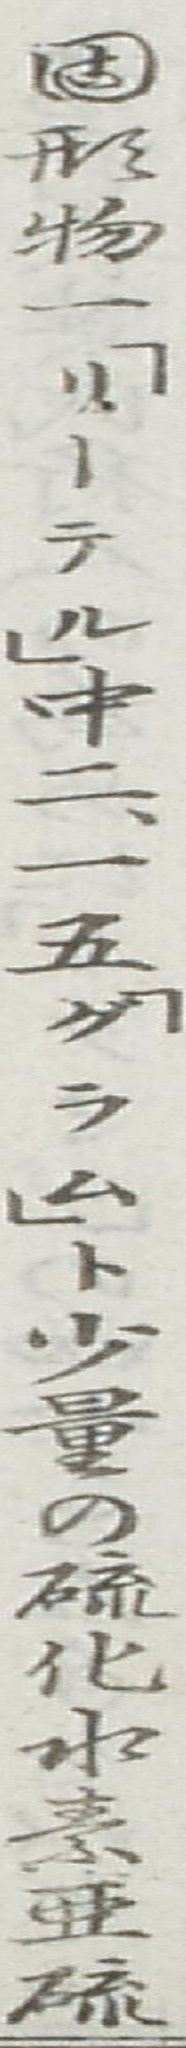固形物一「リーテル」中二、一五「グラム」ト少量の硫化水素亜硫
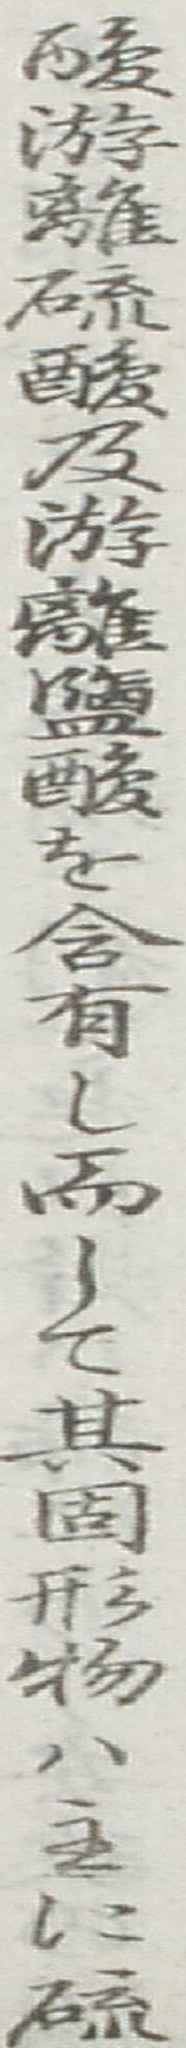酸遊離硫酸及遊離塩酸を含有し而して其固形物は主に硫
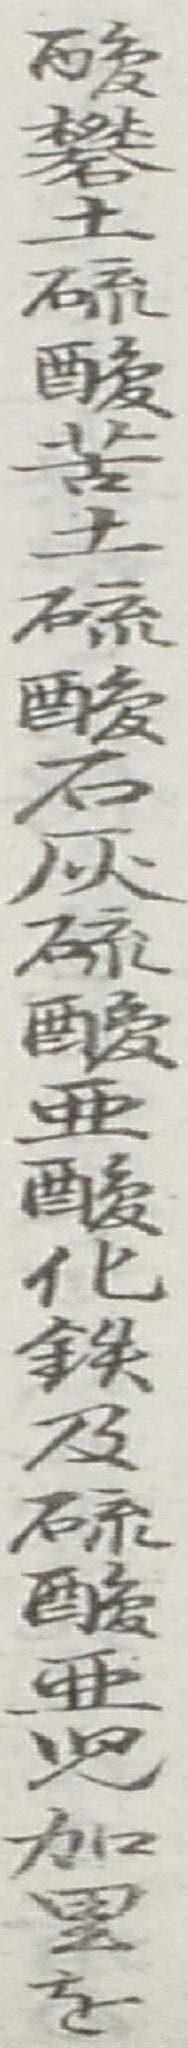酸礬土硫酸苦土硫酸石灰硫酸亜酸化鉄及硫酸亜児加里を
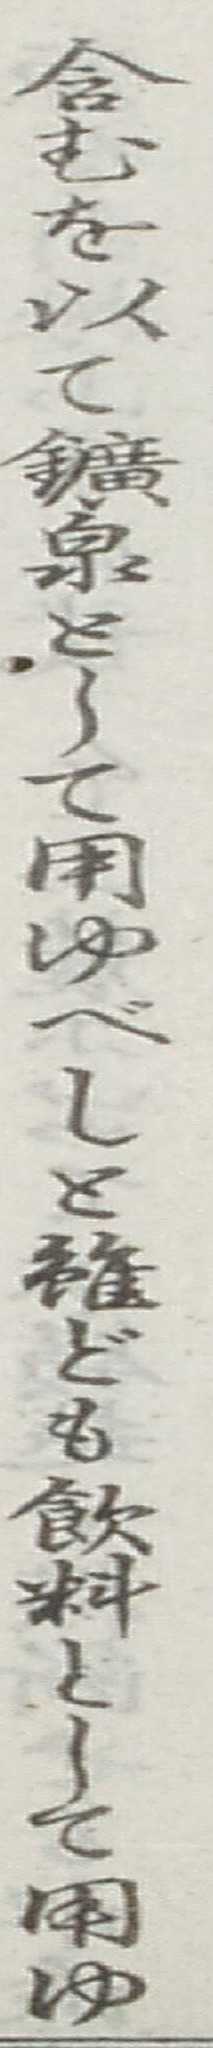含むを以て鉱泉として用ゆべしと雖も飲料として用ゆ
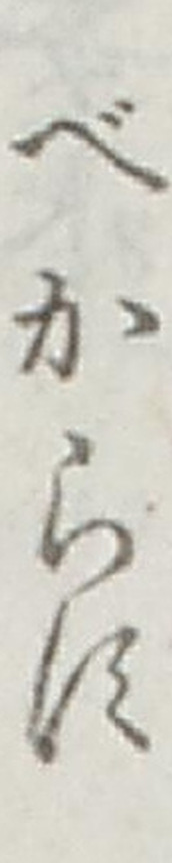べからす
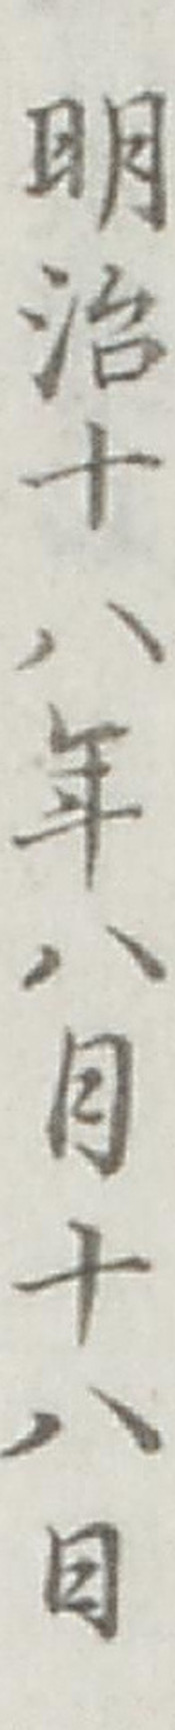明治十八年八月十八日
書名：草津温泉誌　全
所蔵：東京大学地震研究所図書室 Earthquake Research Institute Library, The University of Tokyo, JAPAN
